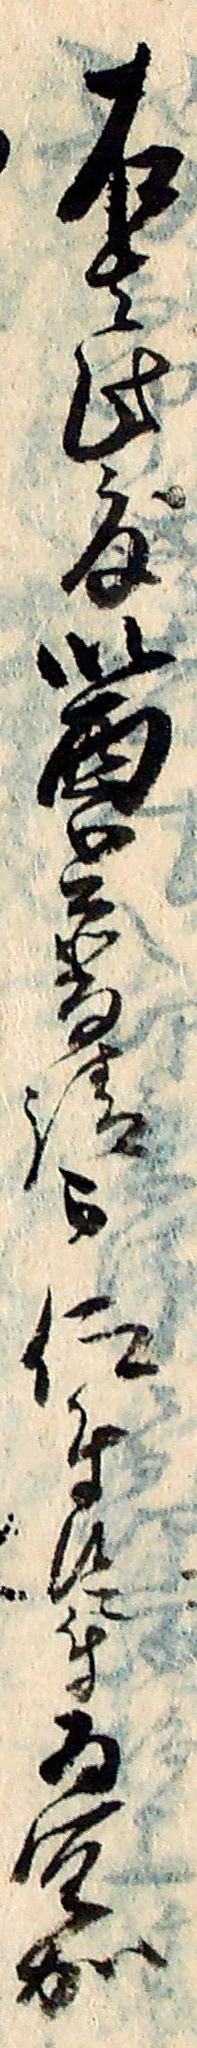右は此度以西御普請被仰付候に付為冥加
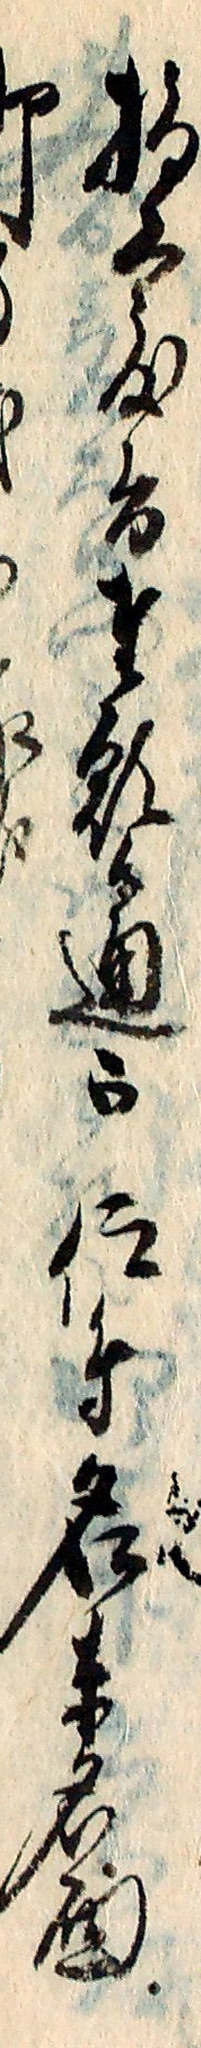指上度旨奉願候通被仰付名東名西
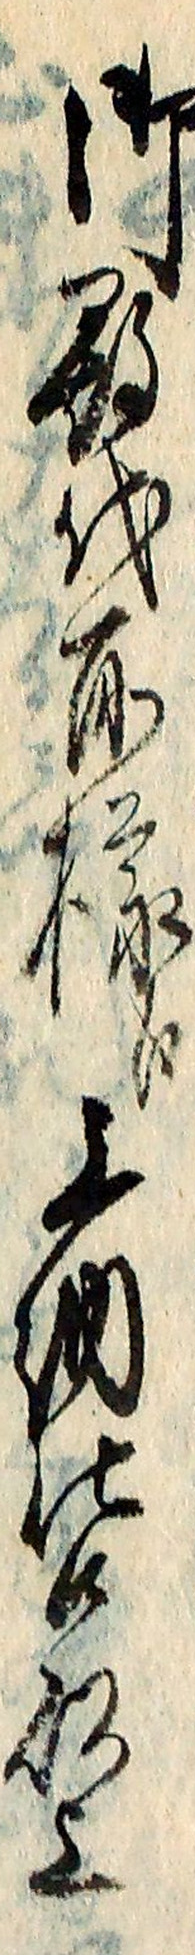御郡代所様え上納仕候以上
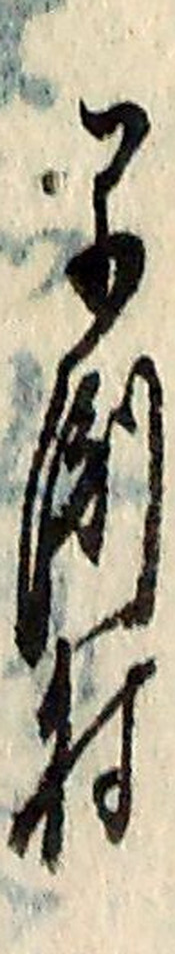早淵村
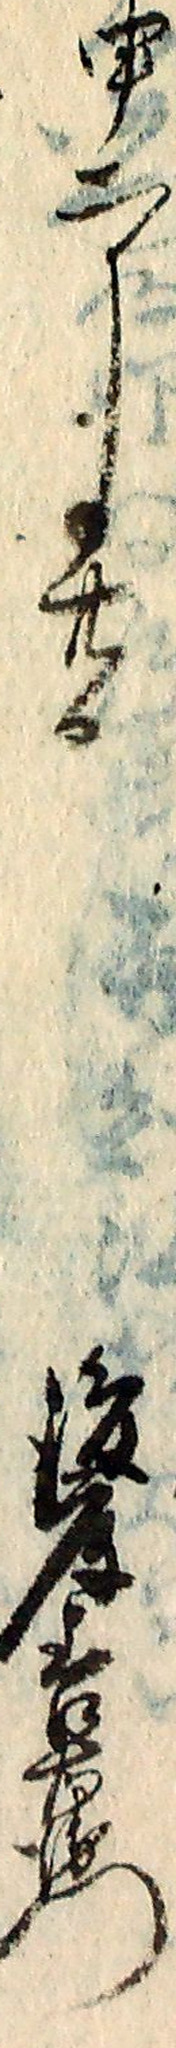申二月廿日後藤善右衛門
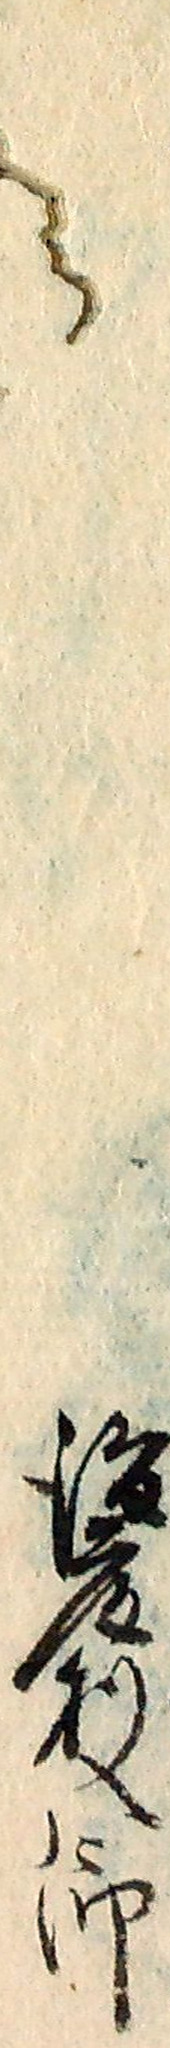後藤利八郎
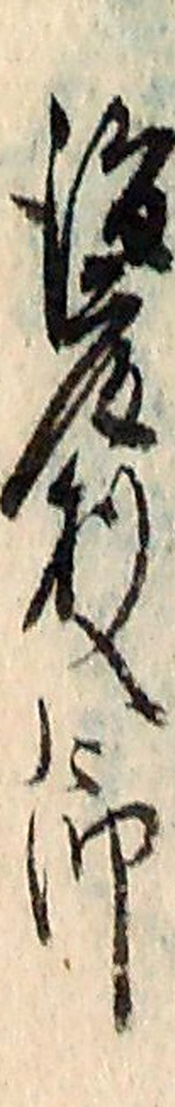後藤利八郎
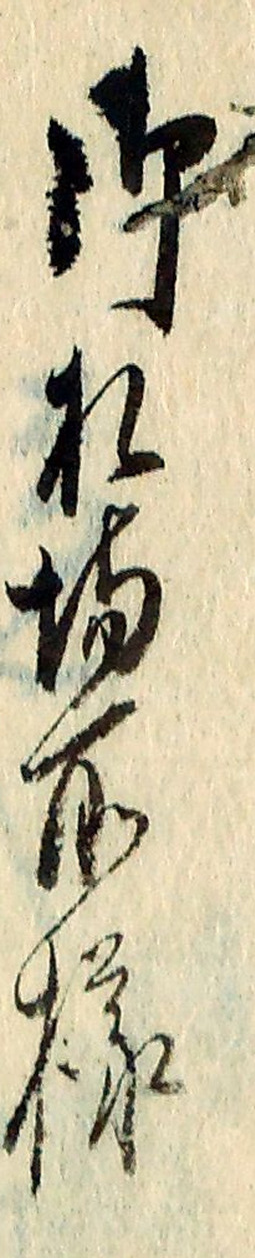御札場所様
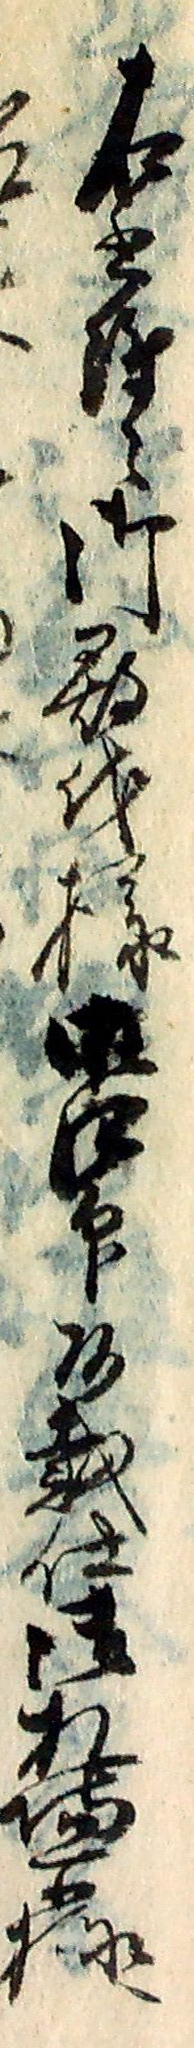右書附に御郡代様御郷印頂戴仕御札場所様へ
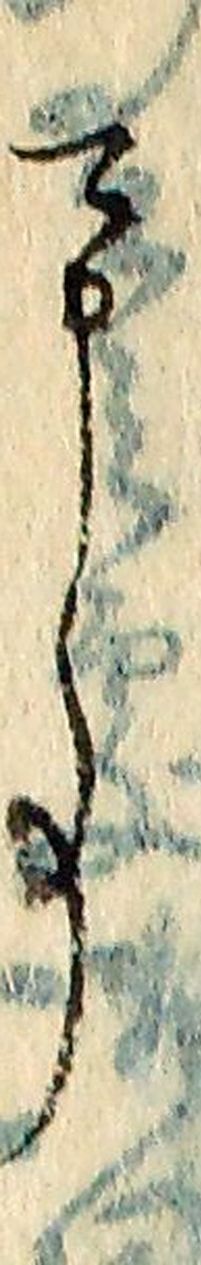可申事
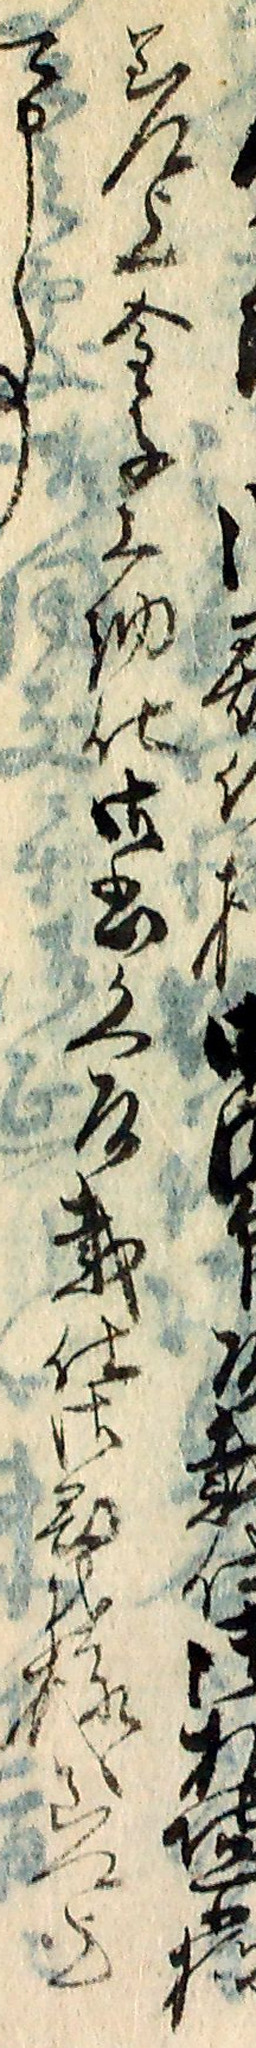差上金子上納仕御書かへ頂戴仕御郡代様へ差上
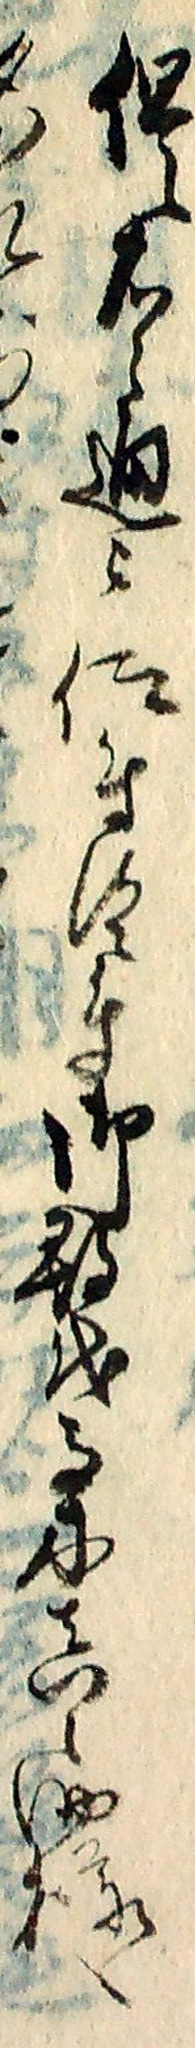但し右之通被仰付候に付御郡代高木真之助様へ
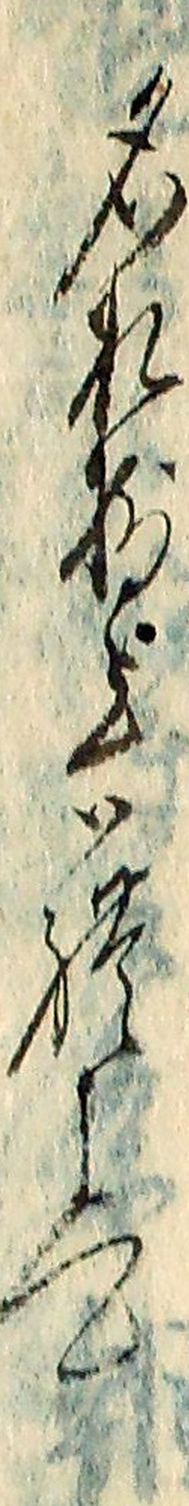名札指上御礼申上候
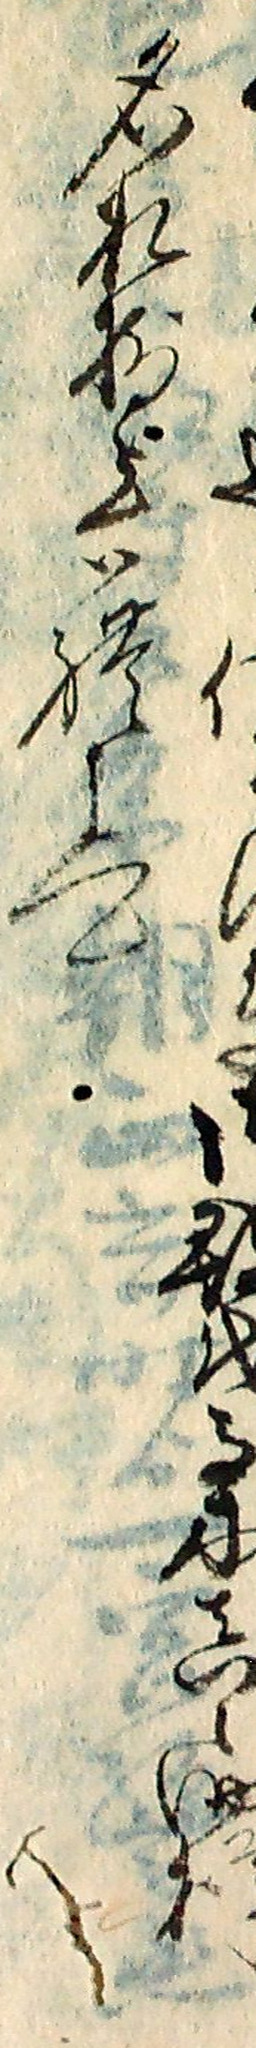名札指上御礼申上候

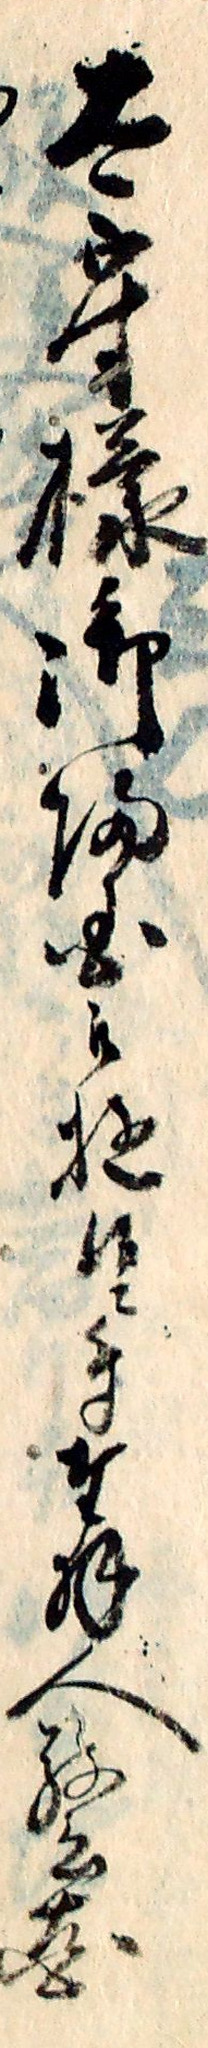太守様御帰国被遊候に付奉拝人警固
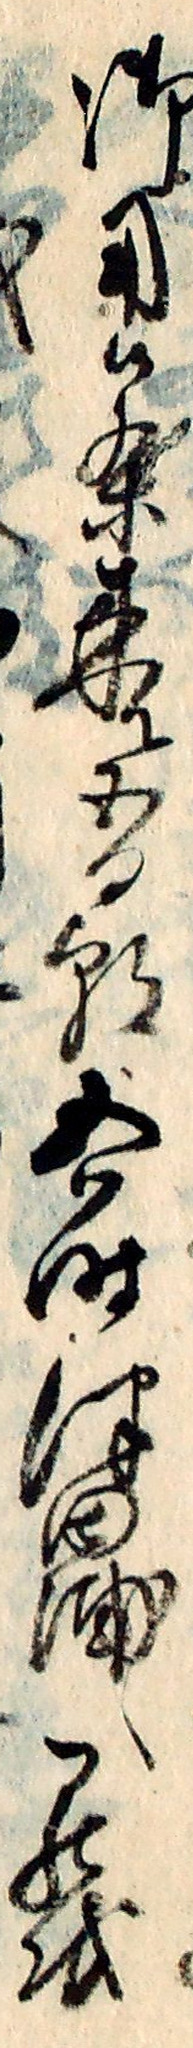御用候条来る五日朝五つ時津田浦へ罷越
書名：諸御願書控(後藤氏壱番）
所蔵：鳴門教育大学 Naruto University of Education
